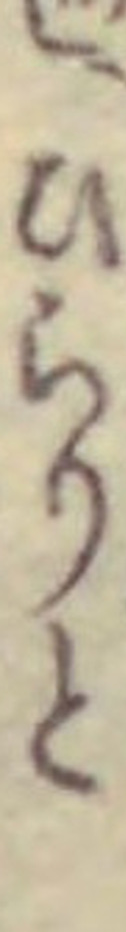ひらりと
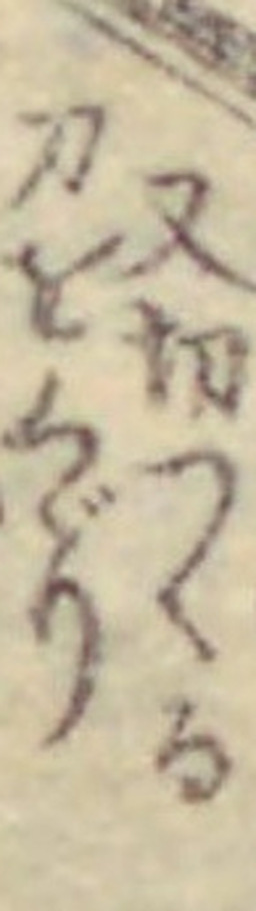刀をくゞり
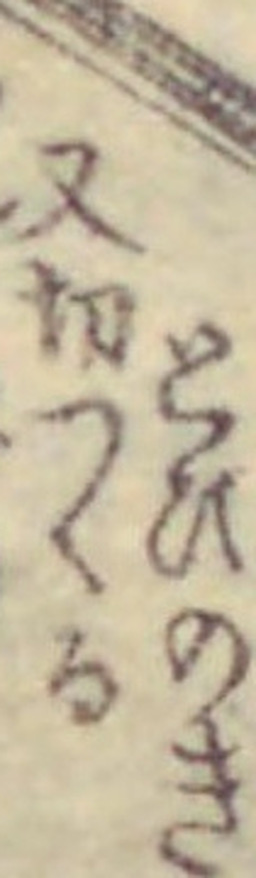又切つくる
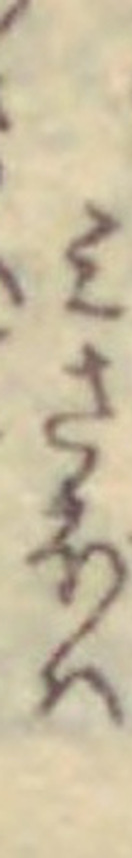みさほは
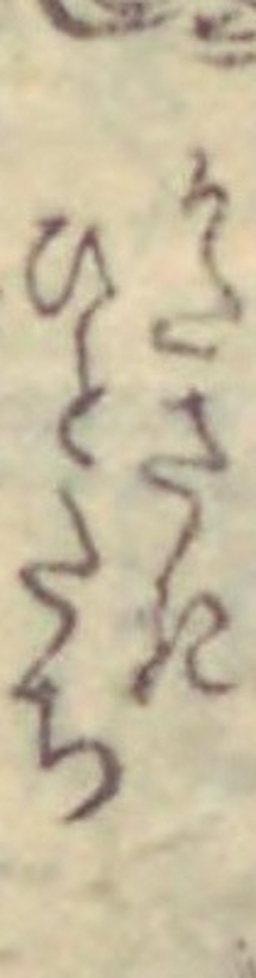ひとたち
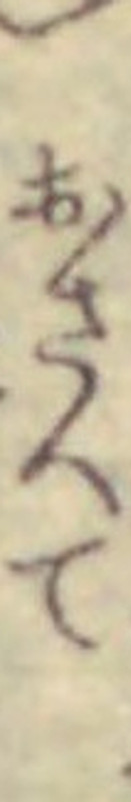おさへて
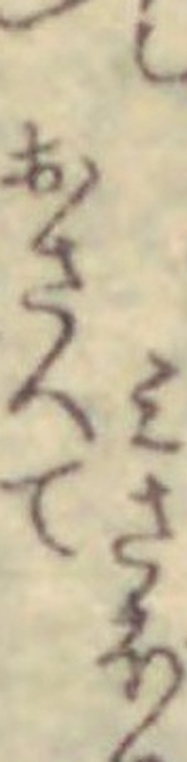おさへて
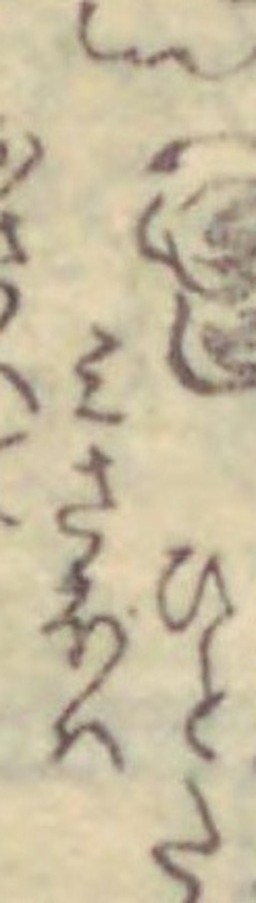みさほは
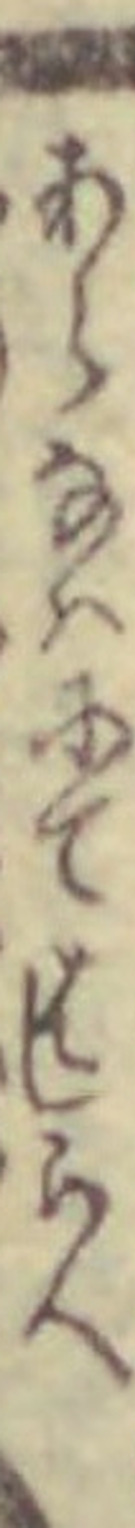あらなはにてはしらへ
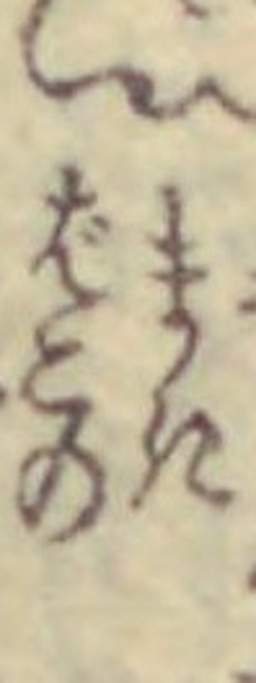ばこの
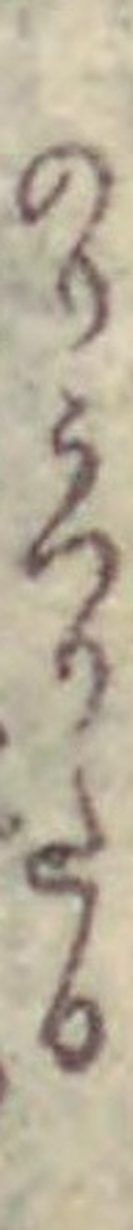のりうつりたる
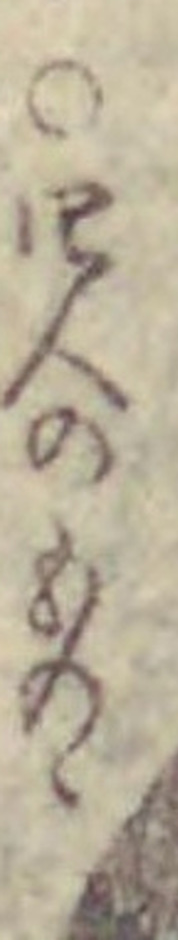○四人のものゝ
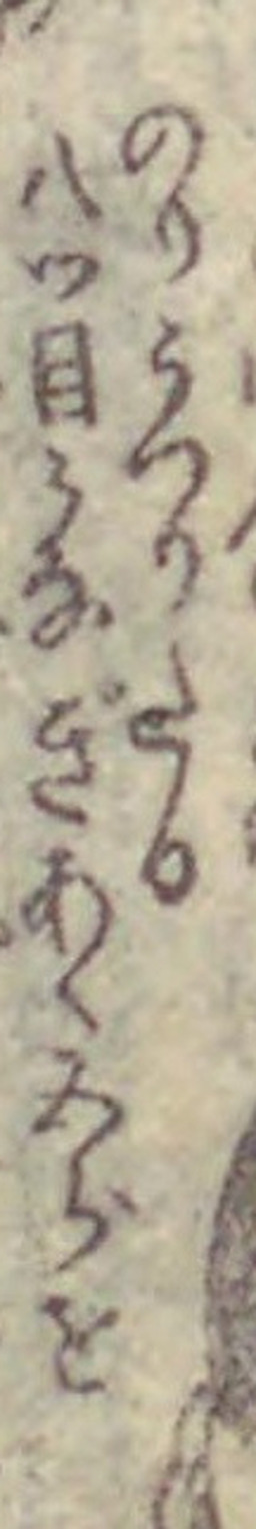八ッ目うなぎあく五郎を
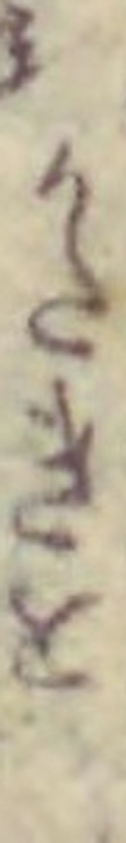かたきを
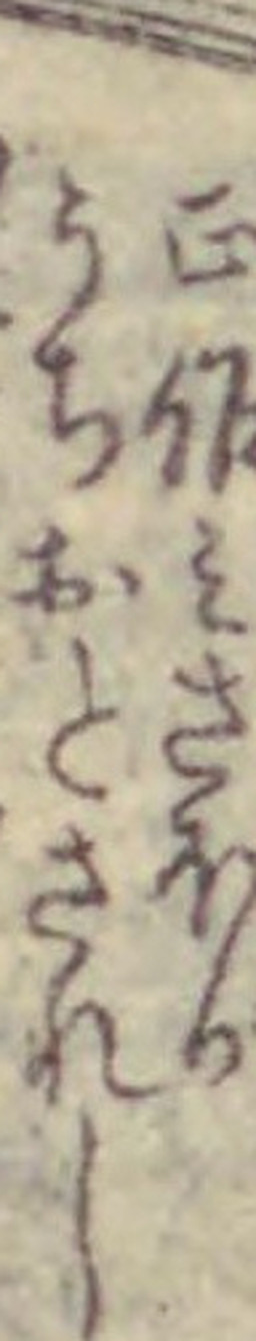うちおとされし
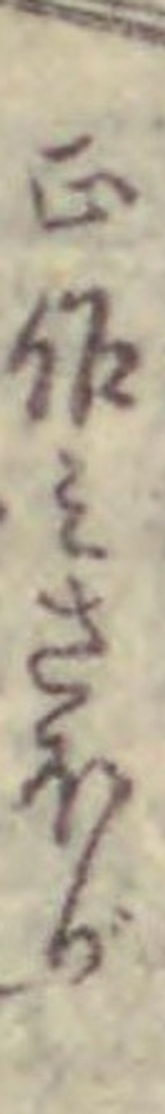正作みさほが
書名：八ツ目鱣因縁物語 3巻
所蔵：国立国会図書館 National Diet Library, JAPAN
